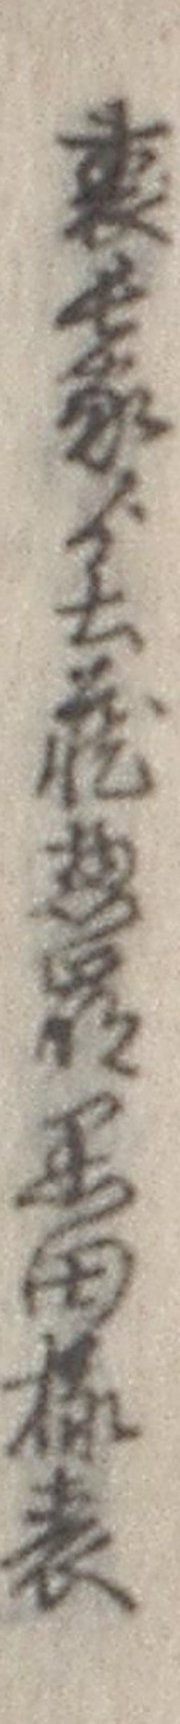裏長家ゟ土蔵惣崩黒田様表
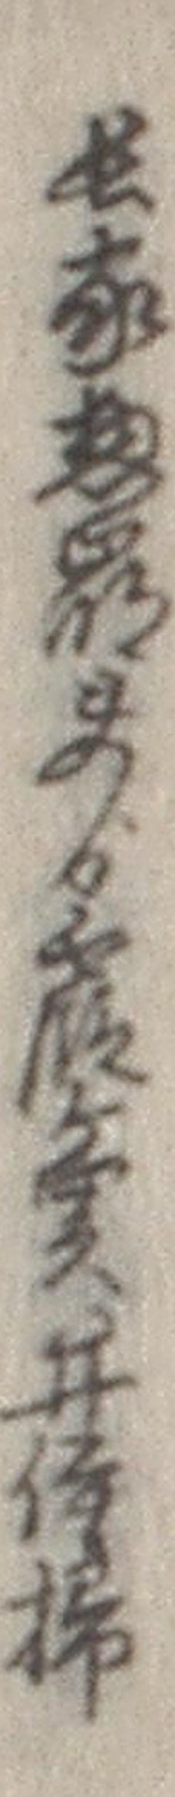長家惣崩夫ゟ霞ヶ関井伊掃
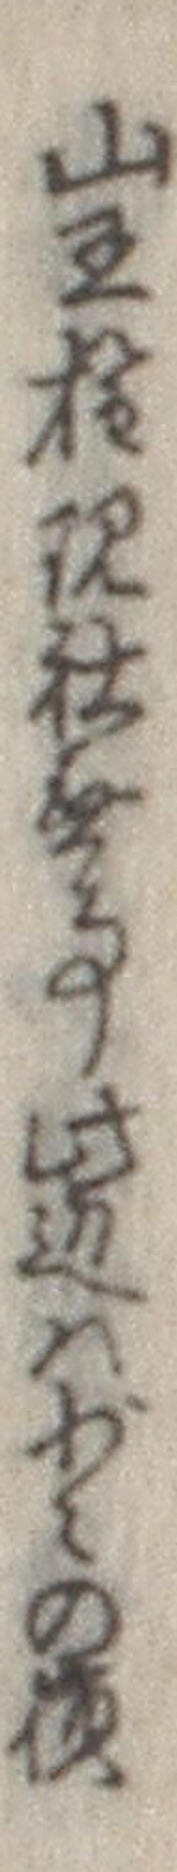山王権現社無事此辺は少々の損
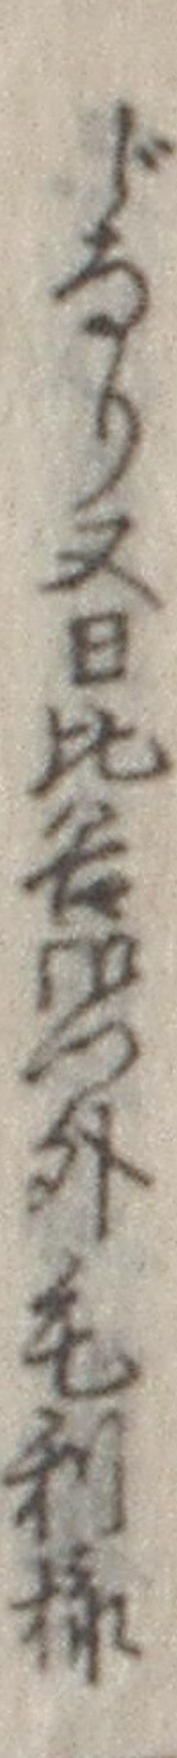じなり又日比谷御門外毛利様
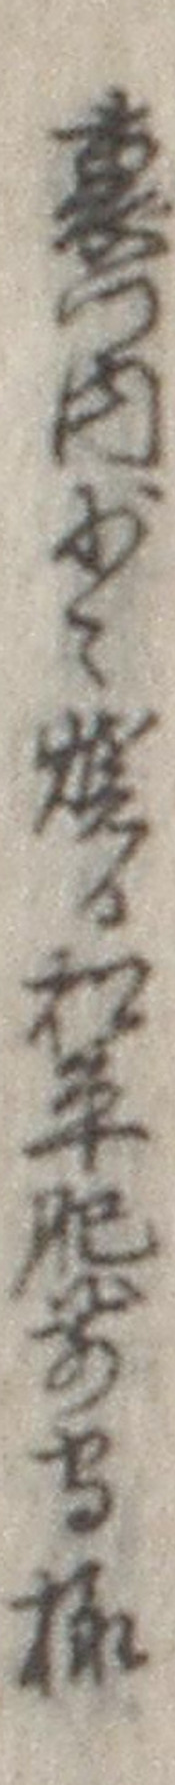裏門内少々焼る松平肥前守様
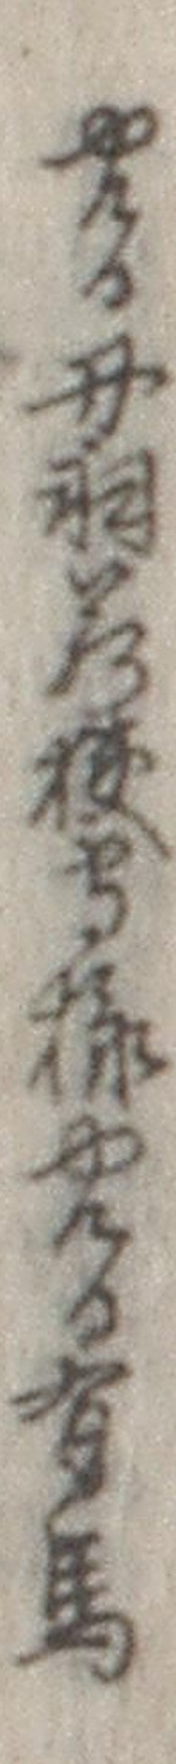やける丹羽若狭守様やける有馬
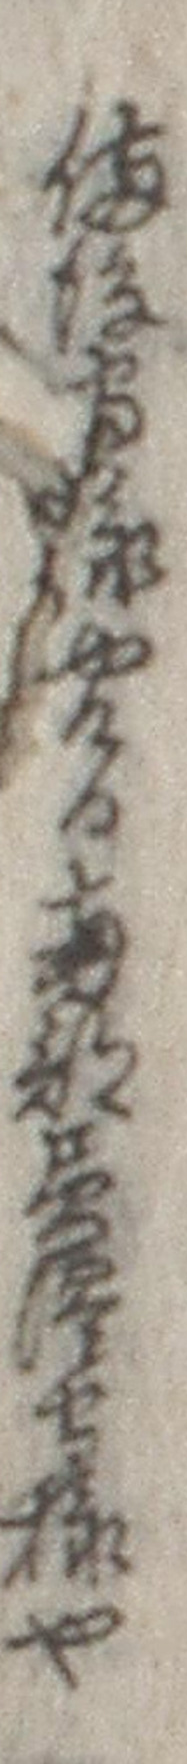備後守様やける南部美濃守様や
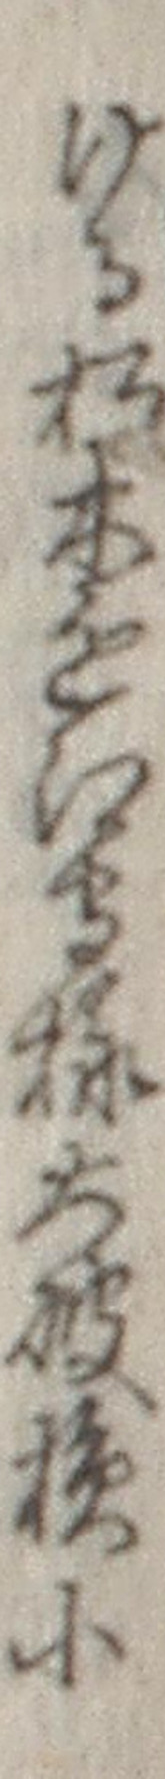ける松木近江守様大破損小
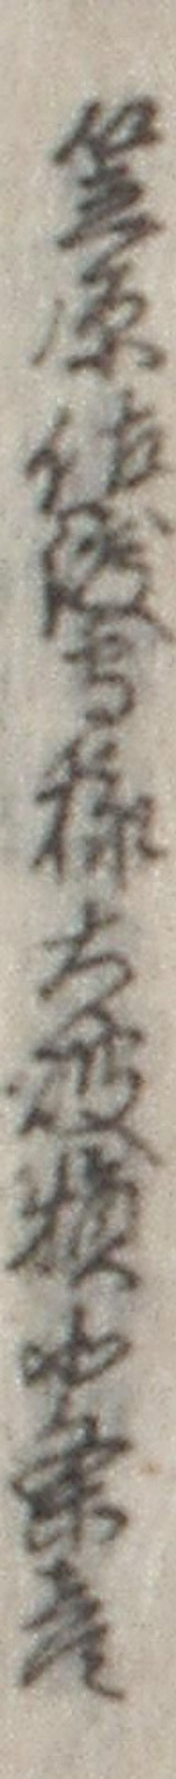笠原佐渡守様大破損北条彦
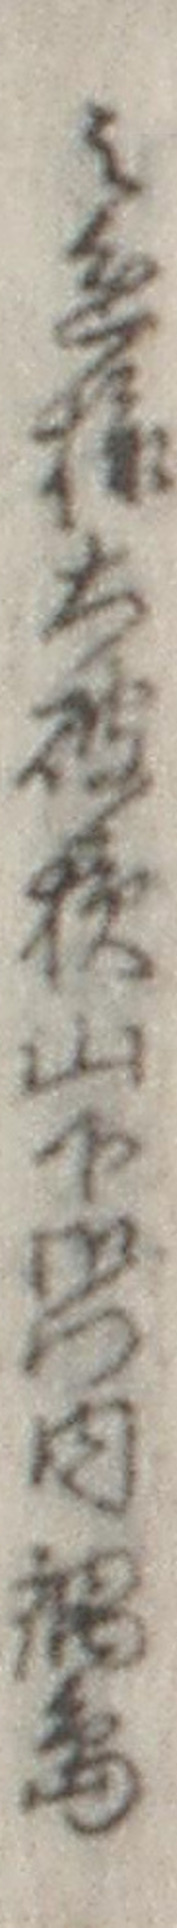之進様大破損山下御門内福島
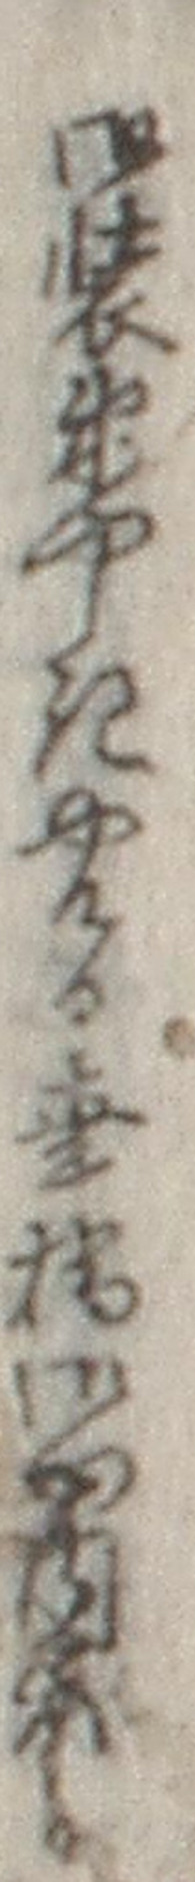御装束やしきやける幸橋御門内やける
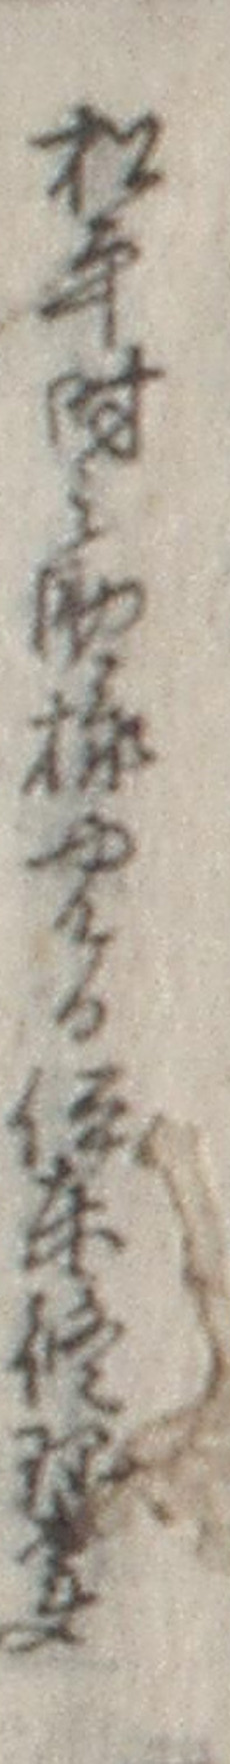松平時之助様やける伊東修理太夫
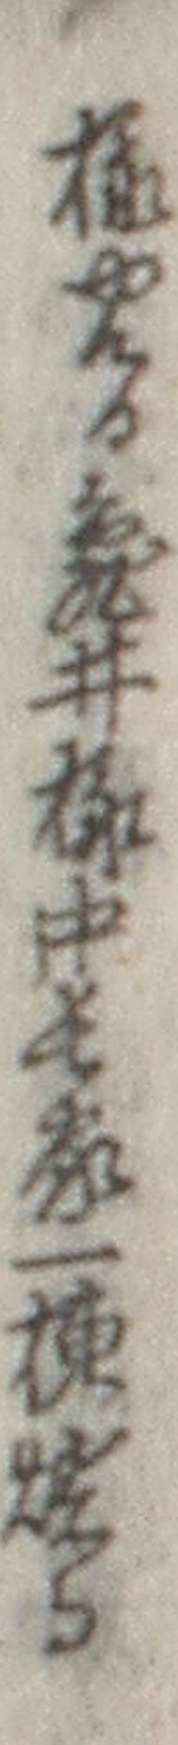様やける亀井様中長家一棟焼る
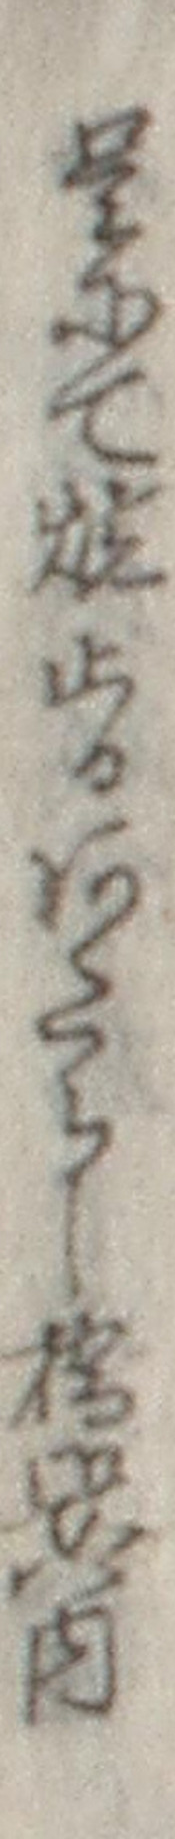呈にて焼止るあたらし橋御門内
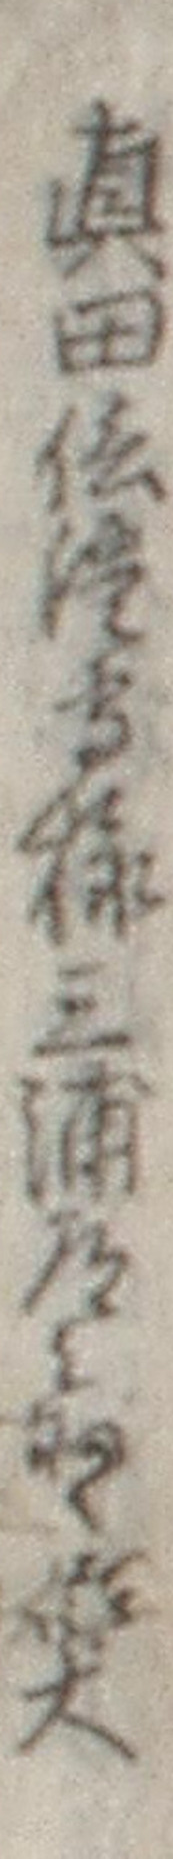真田信濃守様三浦道之将様大
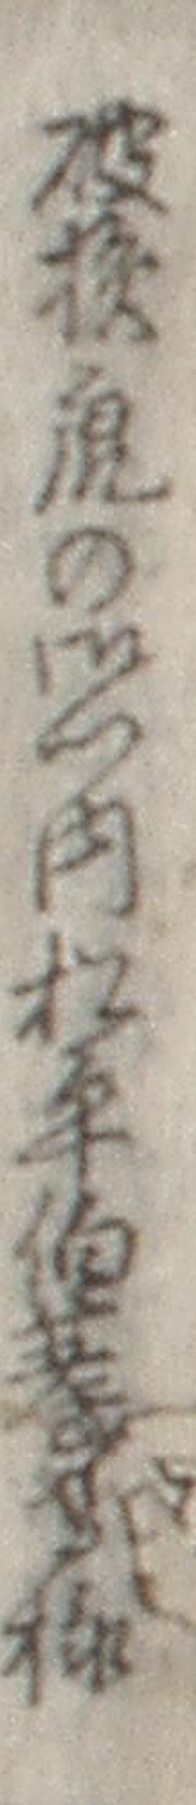破損虎の御門内松平伯耆守様
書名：江戸　大地震臣細録　全
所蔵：東京大学地震研究所図書室 Earthquake Research Institute Library, The University of Tokyo, JAPAN
